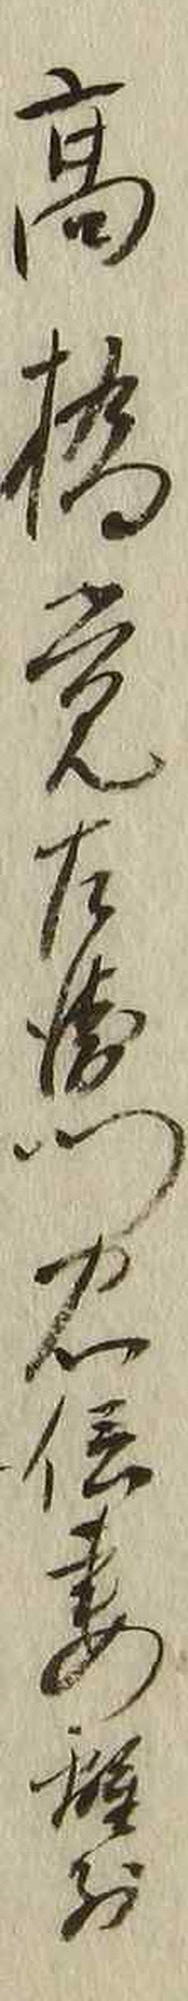女高橋覚左衛門忠信妻離別
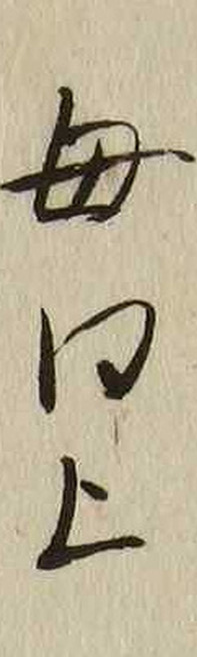母同上
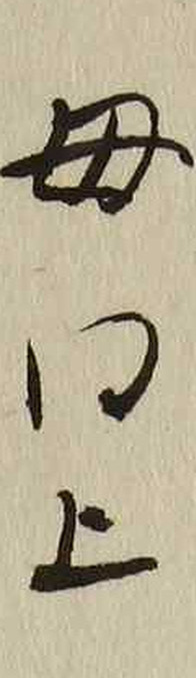母同上
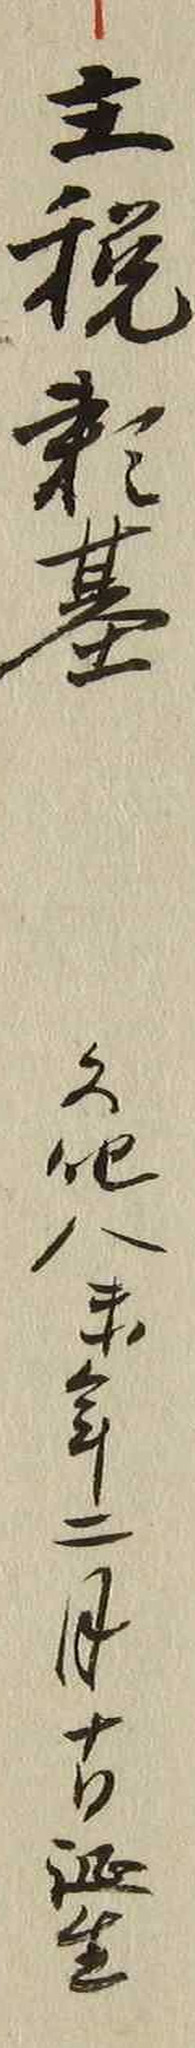主税頼基文化八未年二月十日誕生
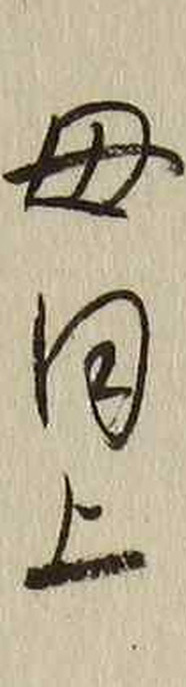母同上
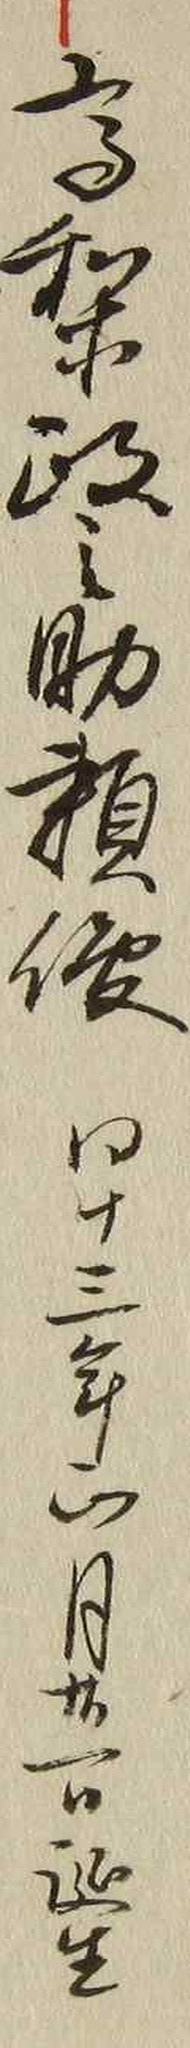高梨政之助頼俊同十三年正月廿一日誕生
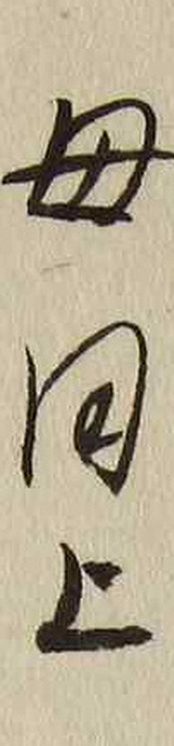母同上
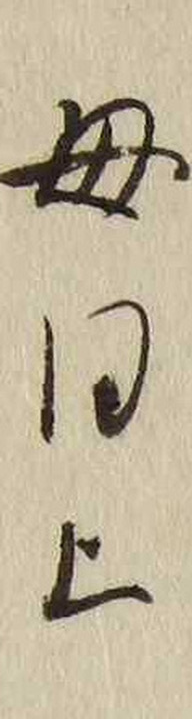母同上

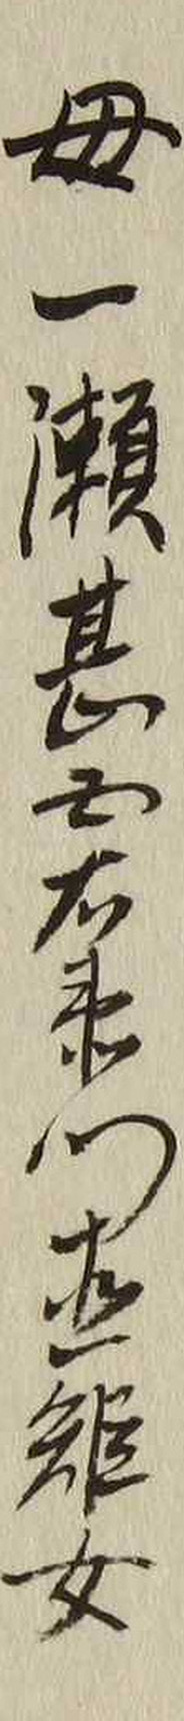母一瀬甚五右衛門直矩女
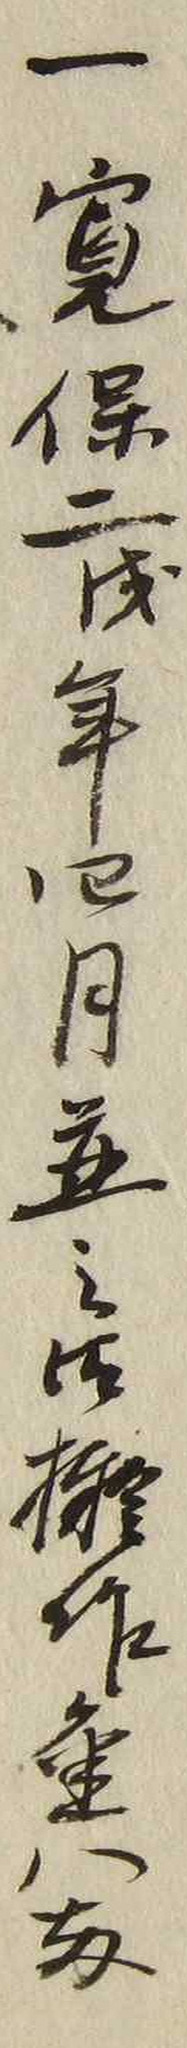一寛保二戌年四月並之御擬作金八両
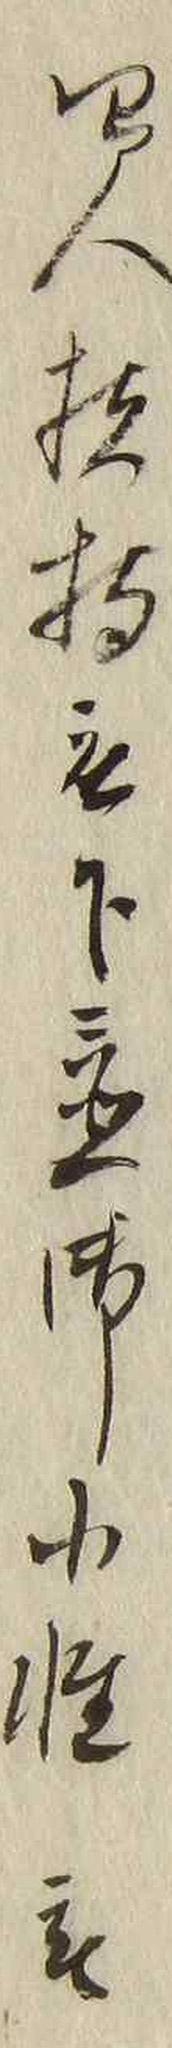四人扶持被下置御小性被

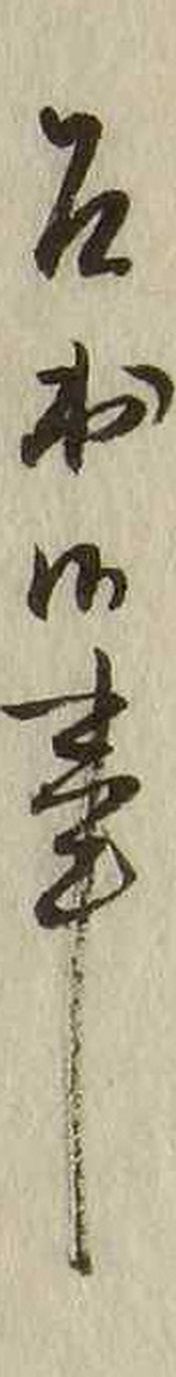召出候事
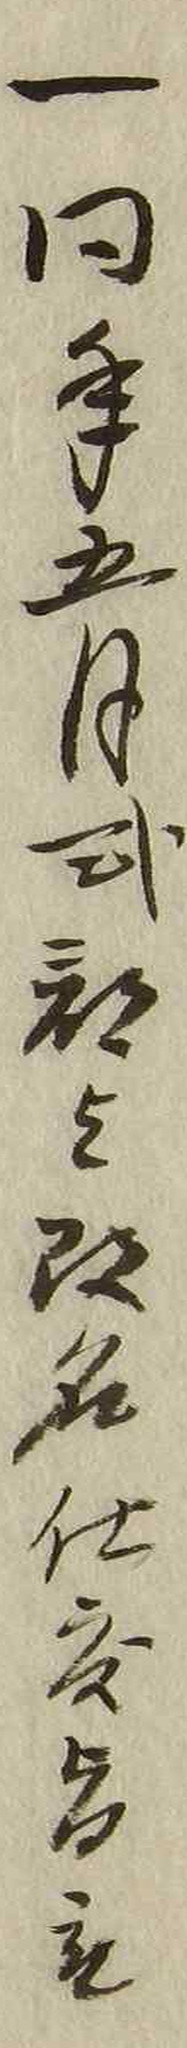一同年五月式部与改名仕度旨被
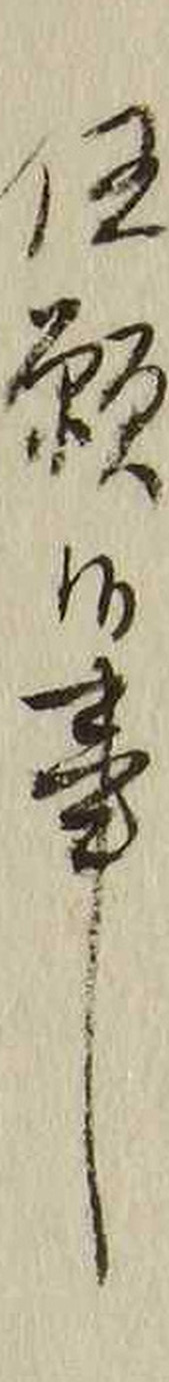任願候事
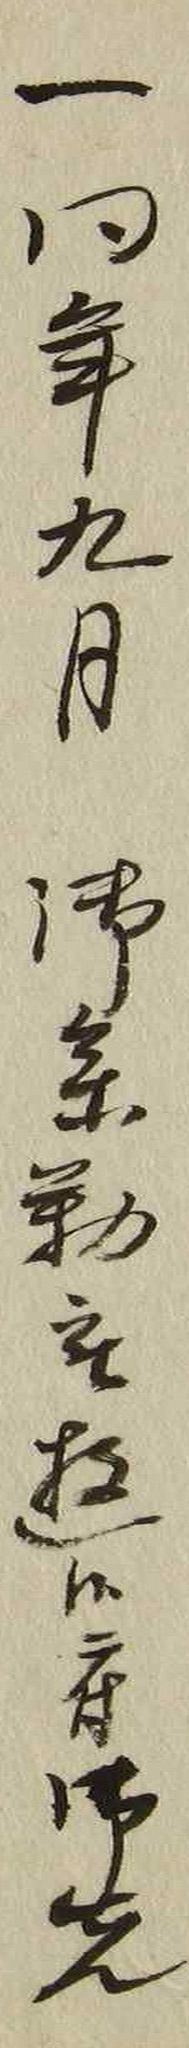一同年九月御参勤被遊候ニ付御先
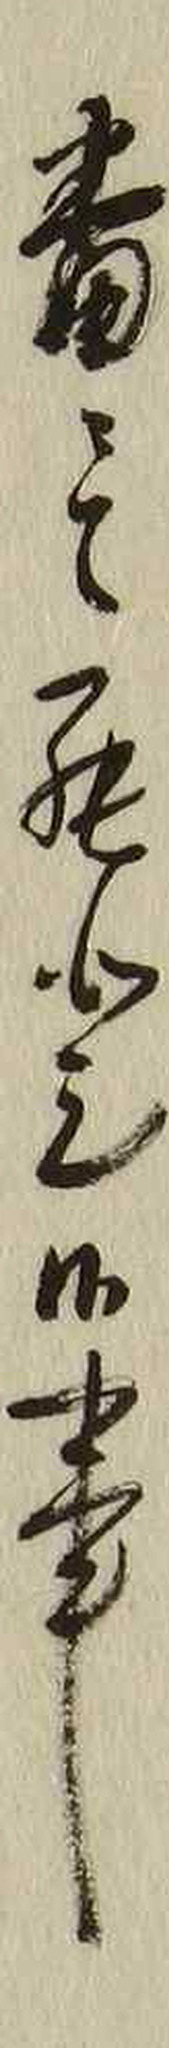番ニて罷登候事
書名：諸士系譜　巻之359　す之部9
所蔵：会津若松市立会津図書館
